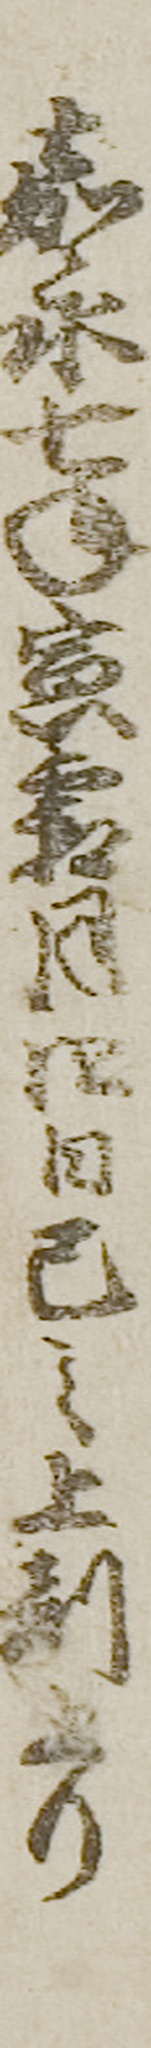嘉永七年寅霜月四日巳の上刻上り
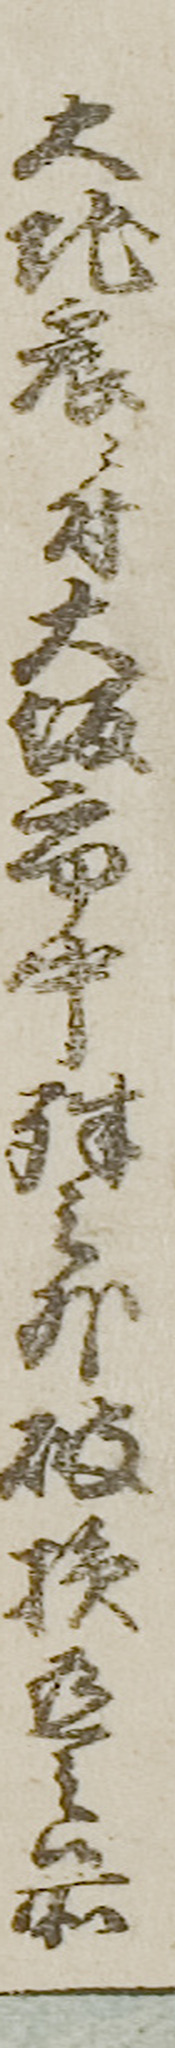大地震に付大阪市中殊の外破損有之候所
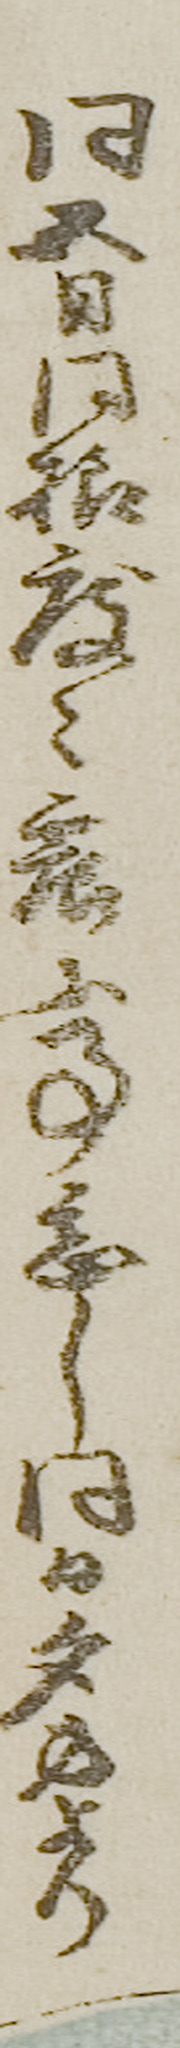同五日同様度々震ふ事甚し同日夕方より
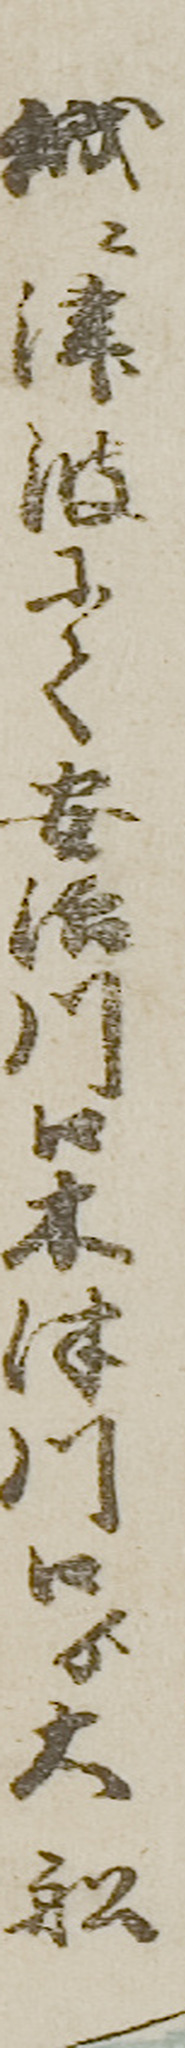俄に津波にて安治川口木津川口ゟ大船
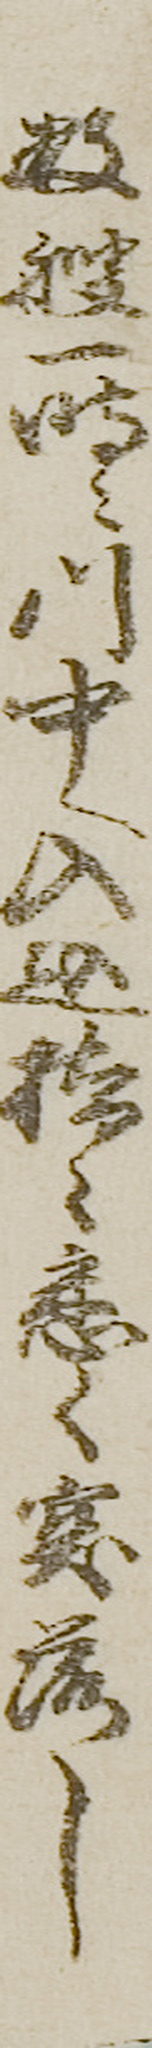数艘一時に川中へ入込橋々悉く突落し
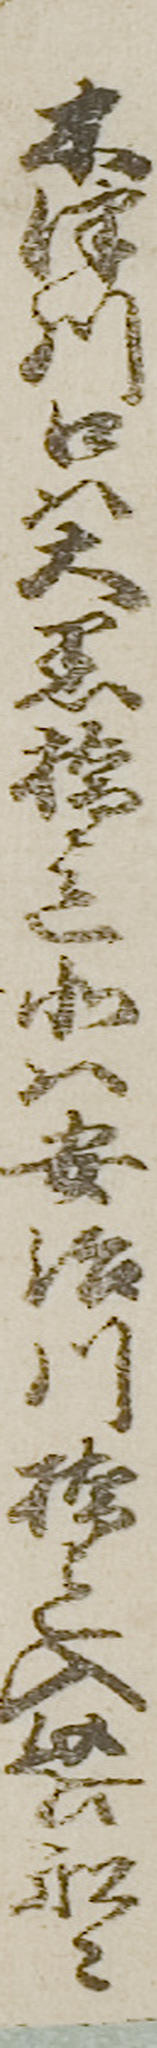木津川口は大黒橋迄北は安治川橋迄入込候船々
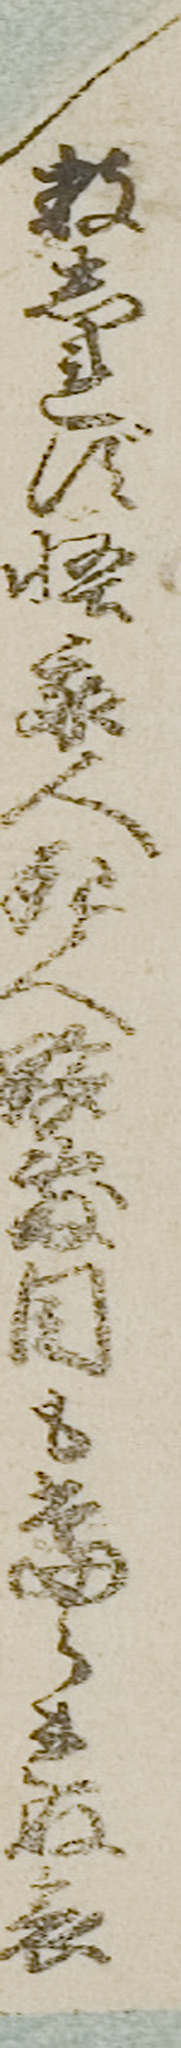数しれず怪我人死人夥敷目も当られぬ哀
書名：[嘉永七年寅霜月大坂大地震]
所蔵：東京大学総合図書館 General Library in the University of Tokyo, JAPAN
